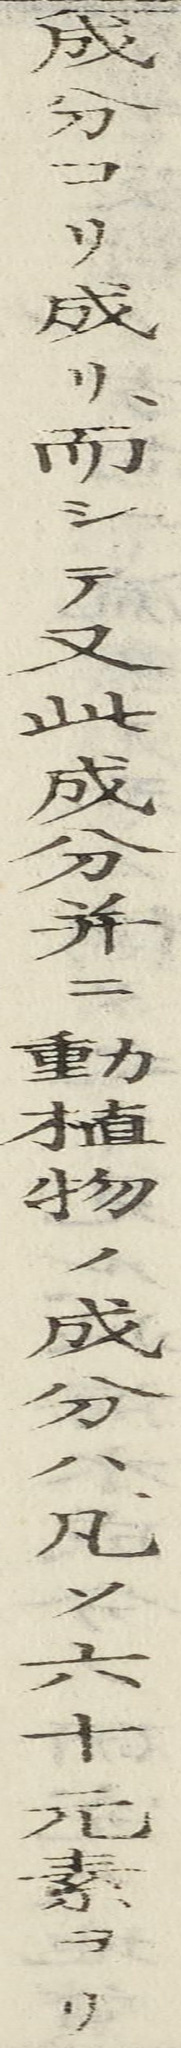成分ヨリ成リ、而シテ又此成分幷ニ動植物ノ成分ハ、凡ソ六十元素ヨリ
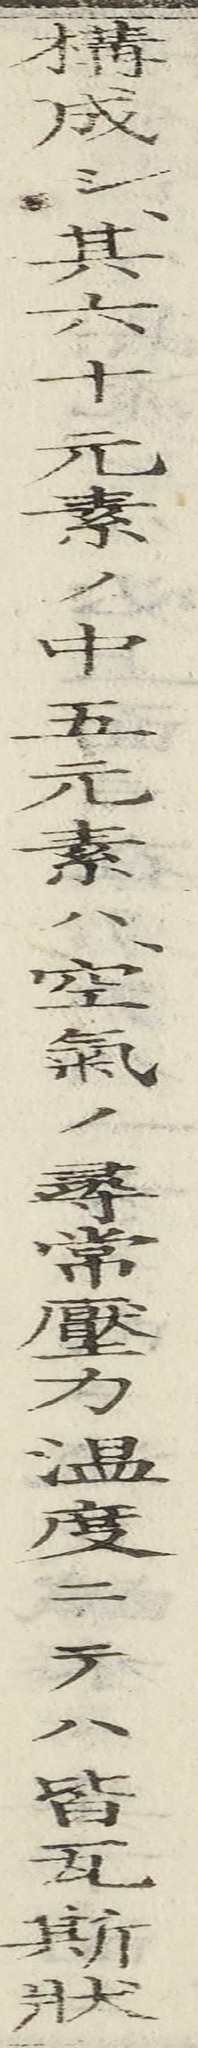構成シ、其六十元素ノ中五元素ハ、空気ノ尋常圧力温度ニテハ皆瓦斯状
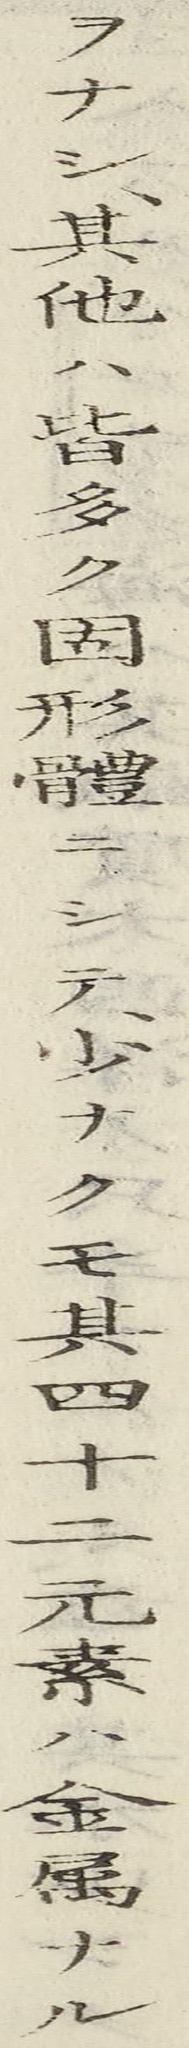ヲナシ、其他ハ皆多ク固形体ニシテ、少ナクモ其四十二元素ハ金属ナル
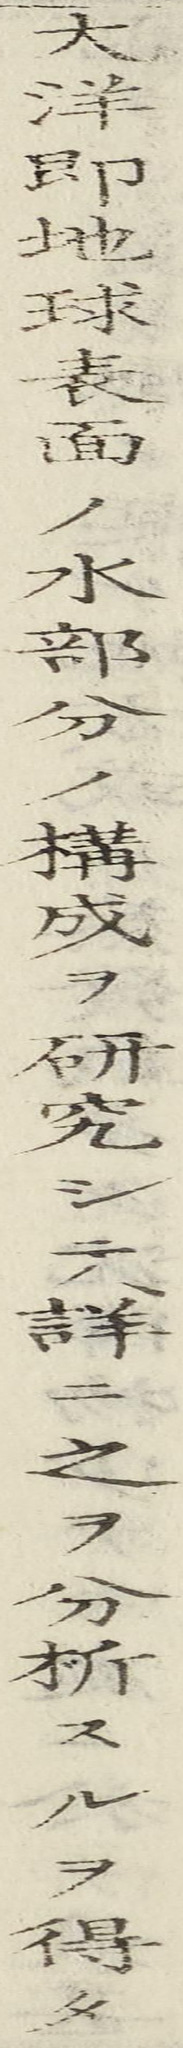大洋即地球表面ノ水部分ノ構成ヲ研究シテ、詳ニ之ヲ分析スルヲ得タ
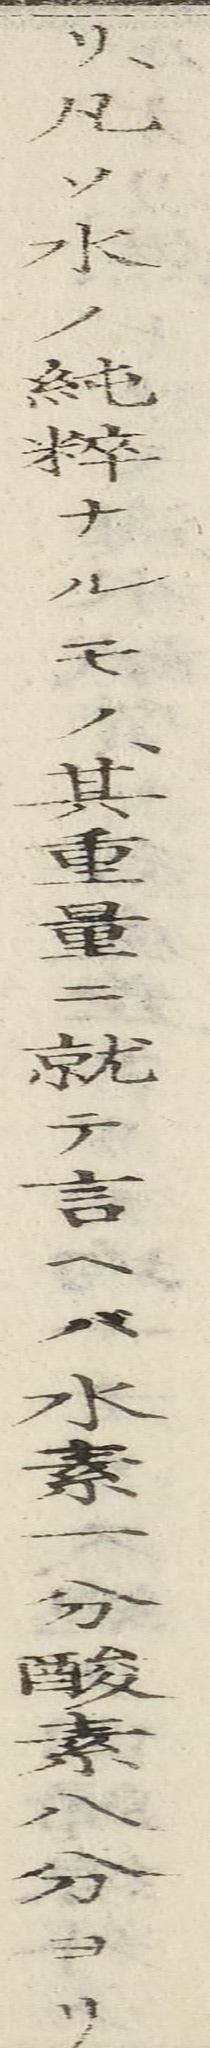リ、凡ソ水ノ純粋ナルモノ、其重量ニ就テ言ヘバ水素一分酸素八分ヨリ
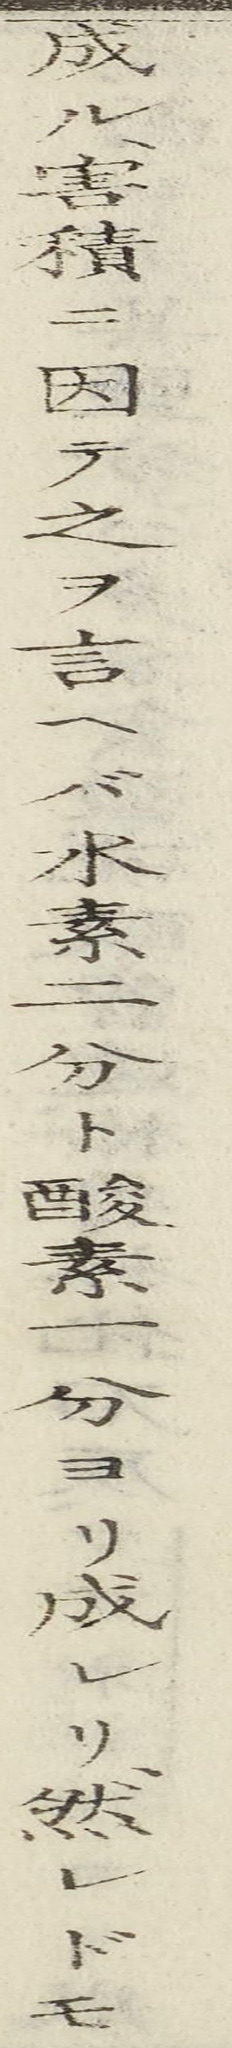成ル、害積ニ因テ之ヲ言ヘバ水素二分ト酸素一分ヨリ成レリ、然レドモ
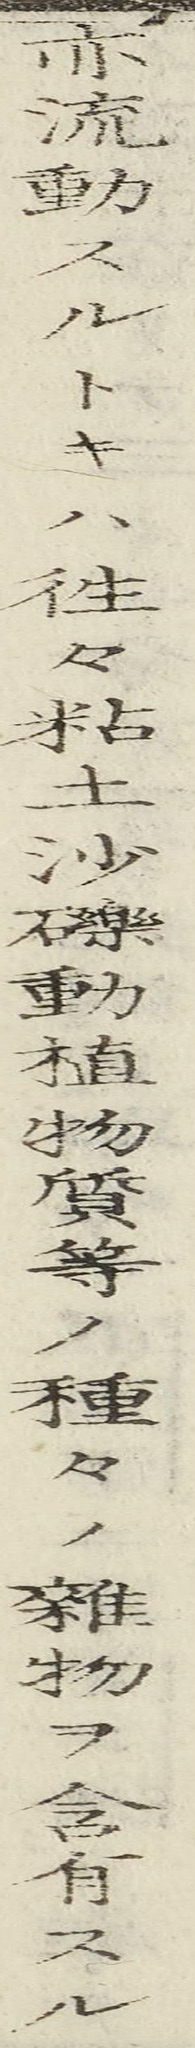亦流動スルトキハ往々粘土沙礫動植物質等ノ種々ノ雑物ヲ含有スル
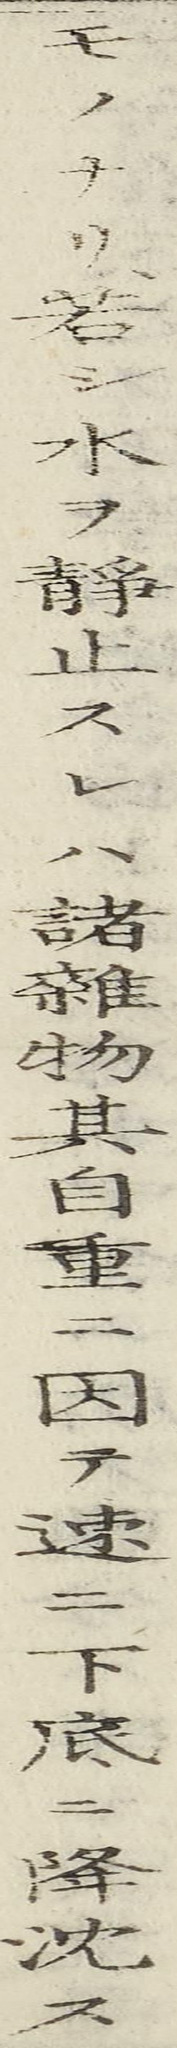モノナリ、若シ水ヲ静止スレハ諸雑物其自重ニ因テ速ニ下底ニ降沈ス
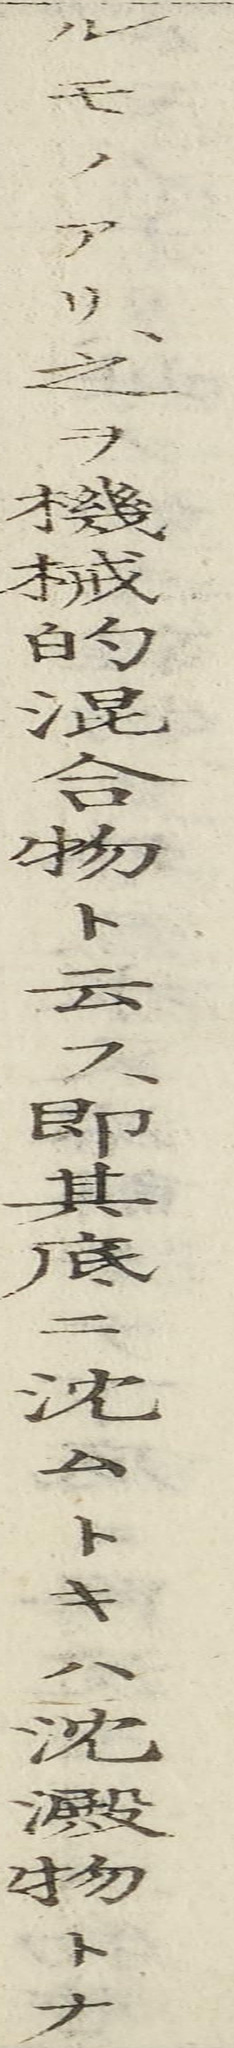ルモノアリ、之ヲ機械的混合物ト云フ、即其底ニ沈ムトキハ沈殿物トナ

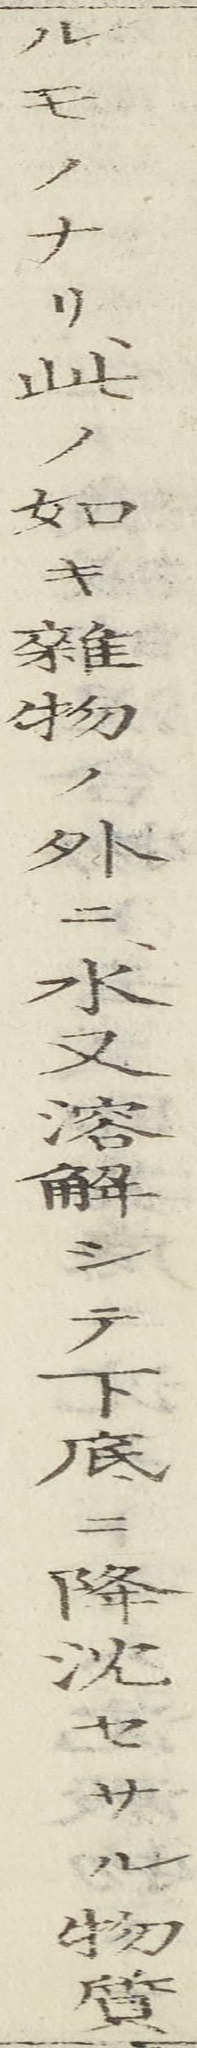ルモノナリ、此ノ如キ雑物ノ外ニ、水又溶解シテ下底ニ降沈セサル物質
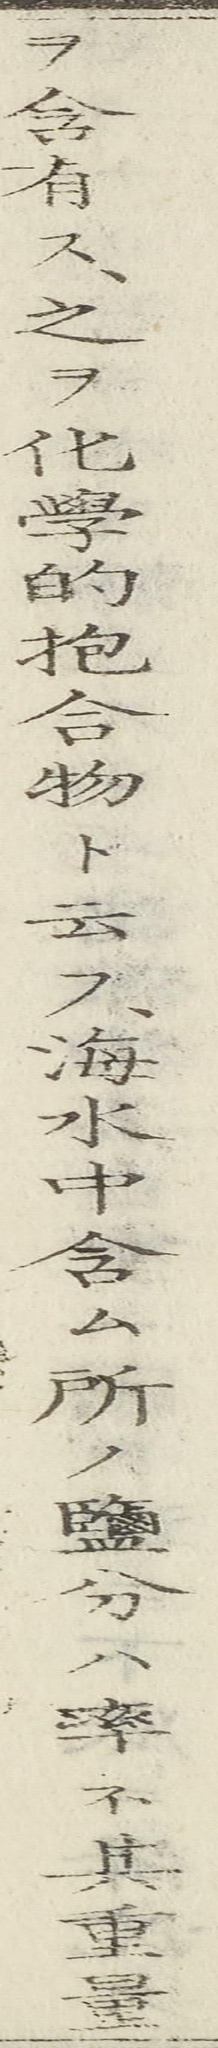ヲ含有ス、之ヲ化学的抱合物ト云フ、海水中含ム所ノ塩分ハ率ネ其重量
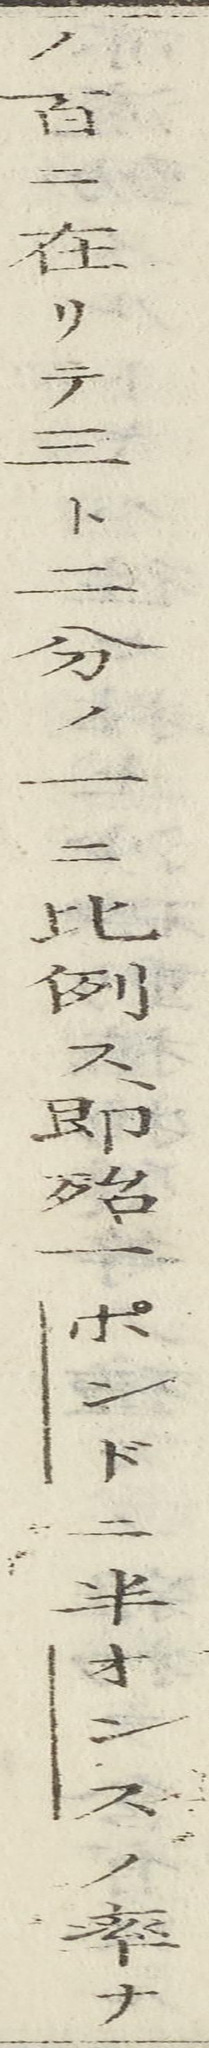ノ百ニ在リテ三ト二分ノ一ニ比例ス、即殆一ポンドニ半オンスノ率ナ
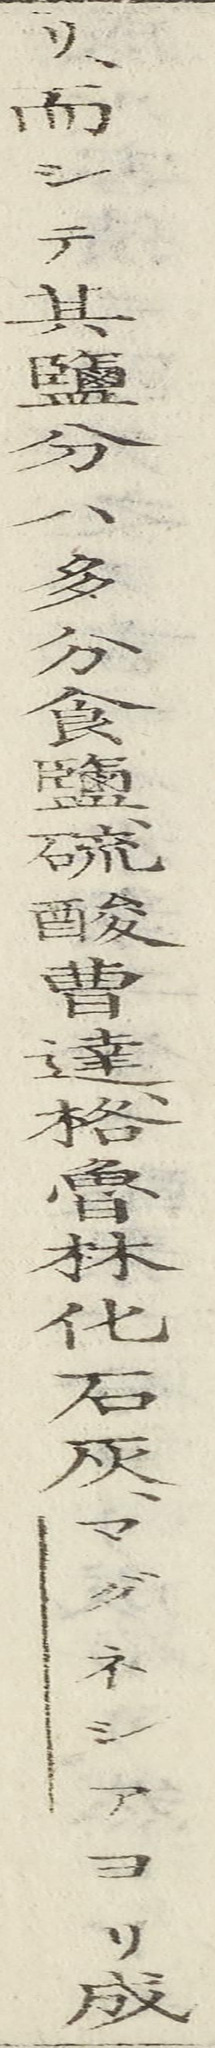リ、而シテ其塩分ハ多分食塩、硫酸曹達、格魯林化石灰、マグネシアヨリ成
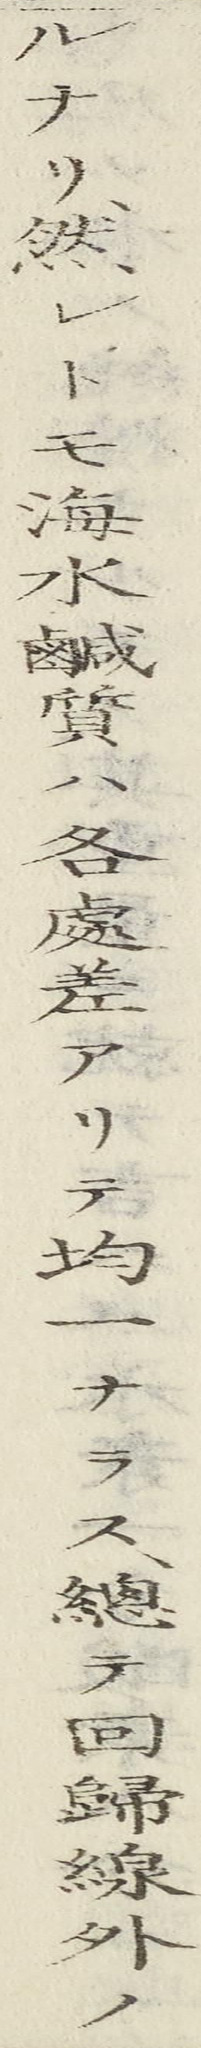ルナリ、然レトモ海水鹹質ハ各処差アリテ均一ナラス、総テ回帰線外ノ
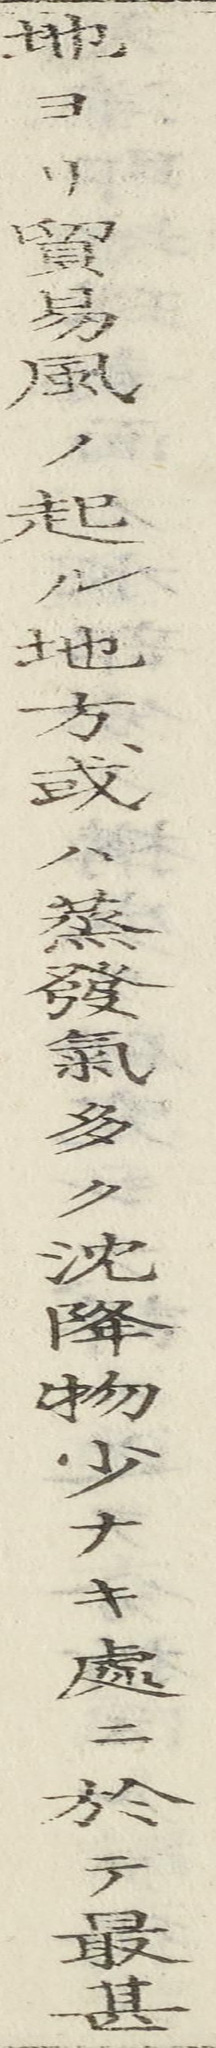地ヨリ貿易風ノ起ル地方、或ハ蒸発気多ク沈降物少ナキ処ニ於テ最甚
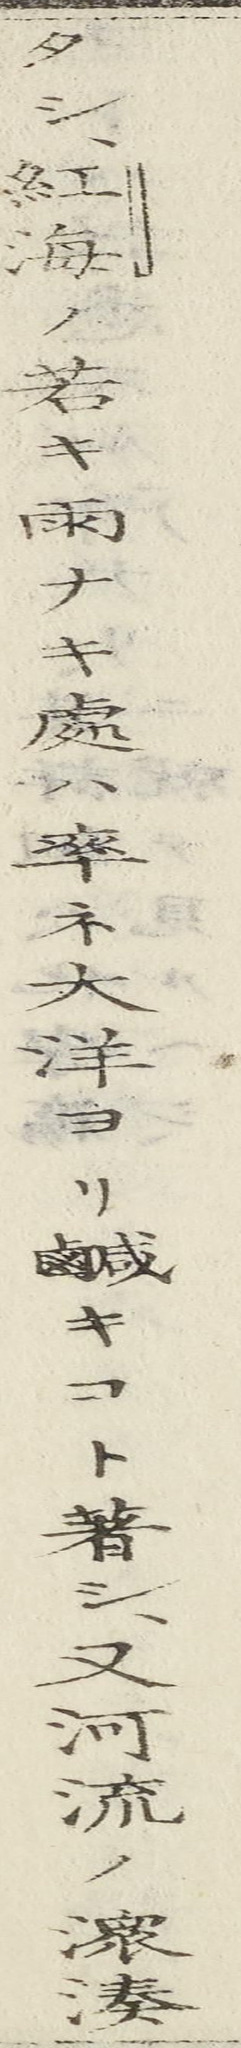タシ、紅海ノ若キ雨ナキ処ハ率ネ大洋ヨリ鹹キコト著シ、又河流ノ潨湊
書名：百科全書　地文學　全
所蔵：東京大学地震研究所図書室 Earthquake Research Institute Library, The University of Tokyo, JAPAN
